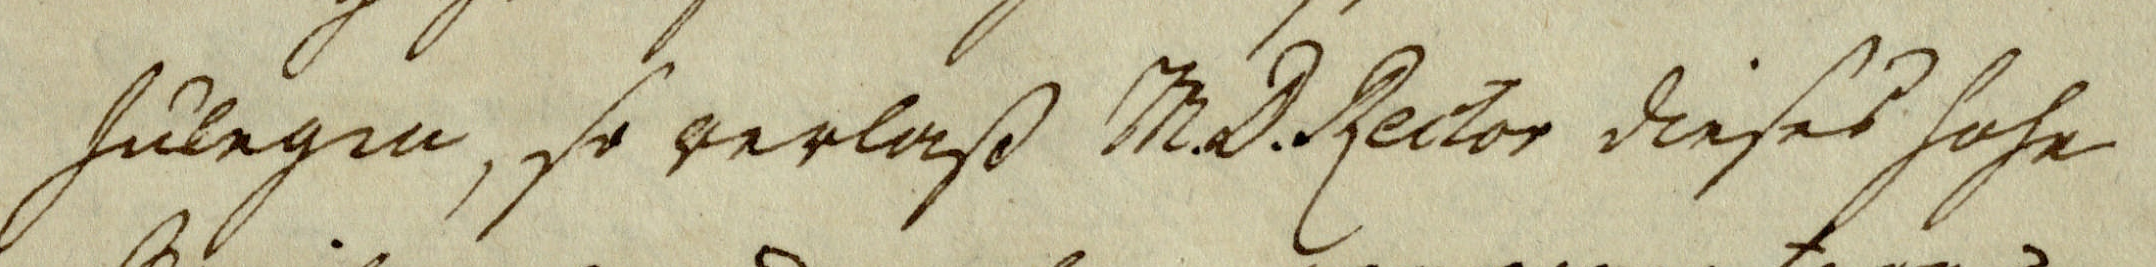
zulegen, so verlaß M Rector dieses hohe
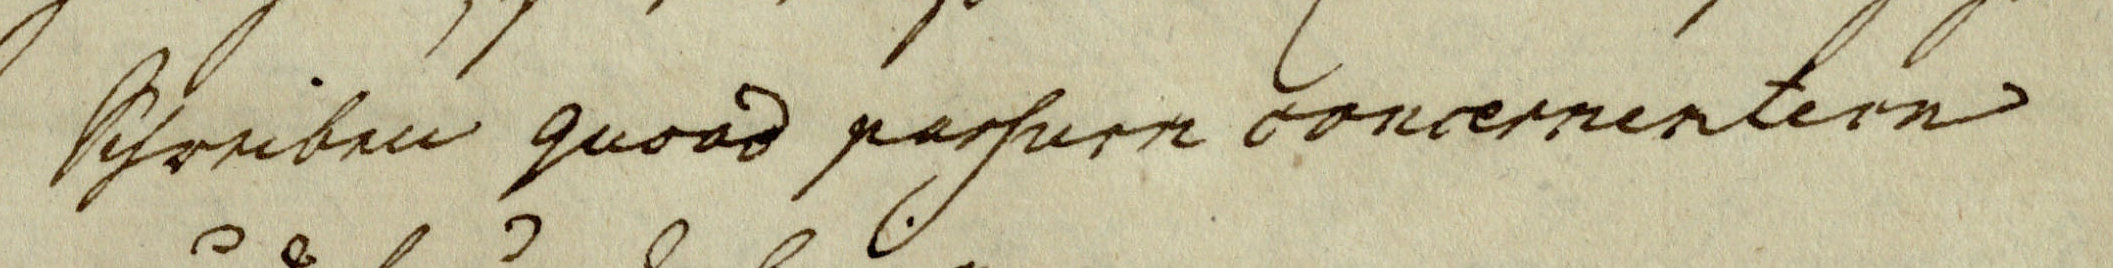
Schreiben quoad passum concernentem
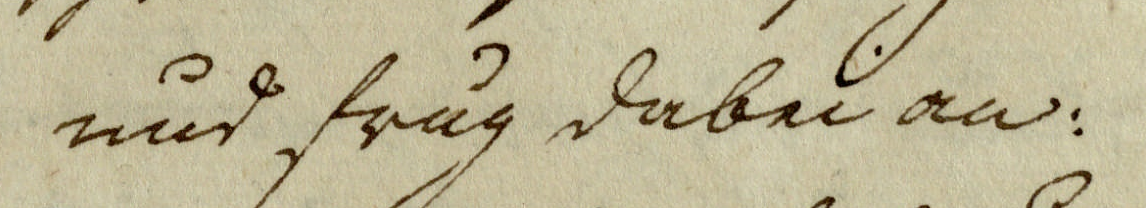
und frug dabei an:
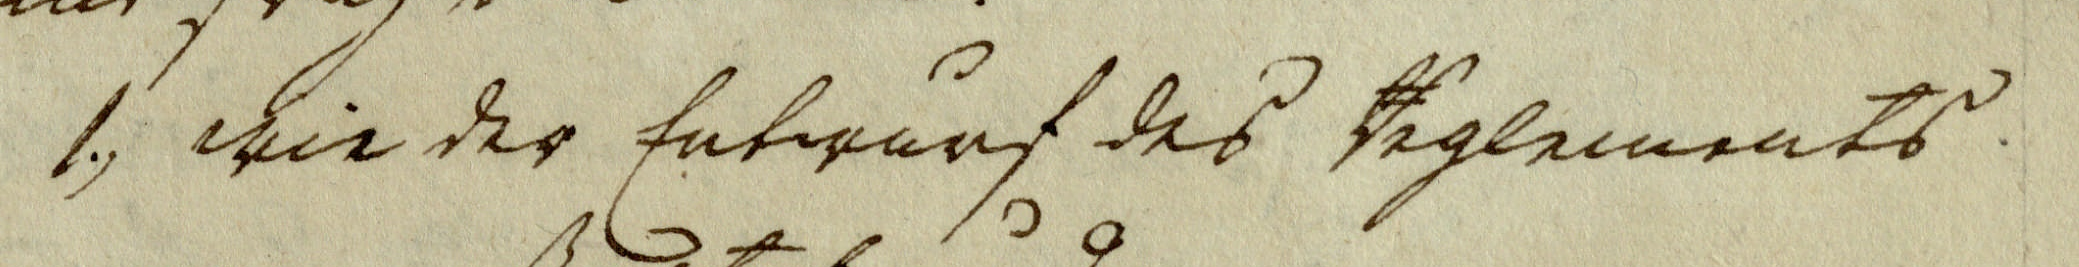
1. Wie der Entwurf des Reglements
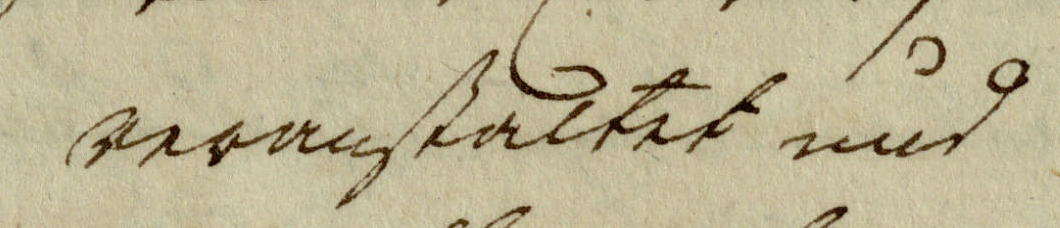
veranstaltet und
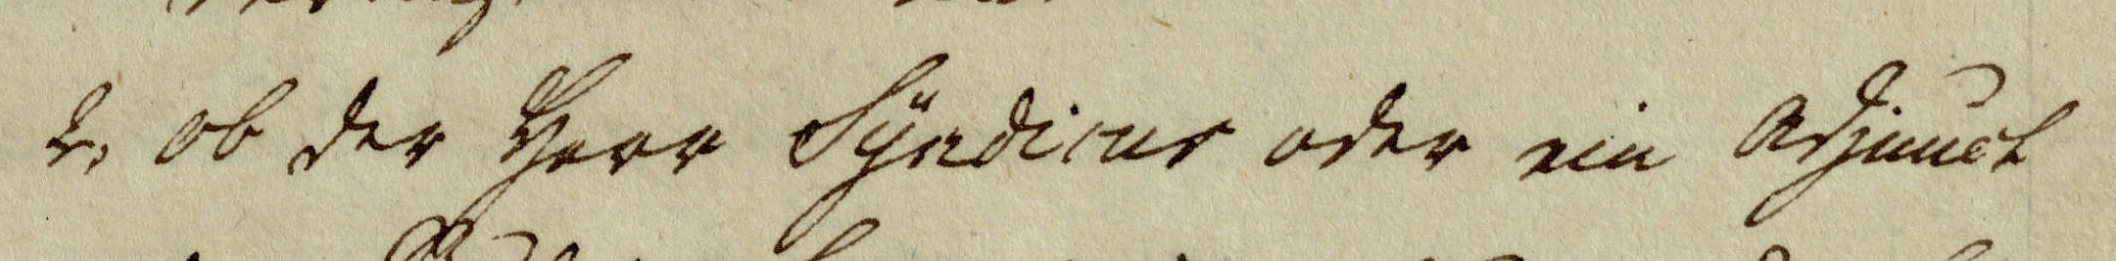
2., ob der Herr Sÿndicus oder ein Adjunct
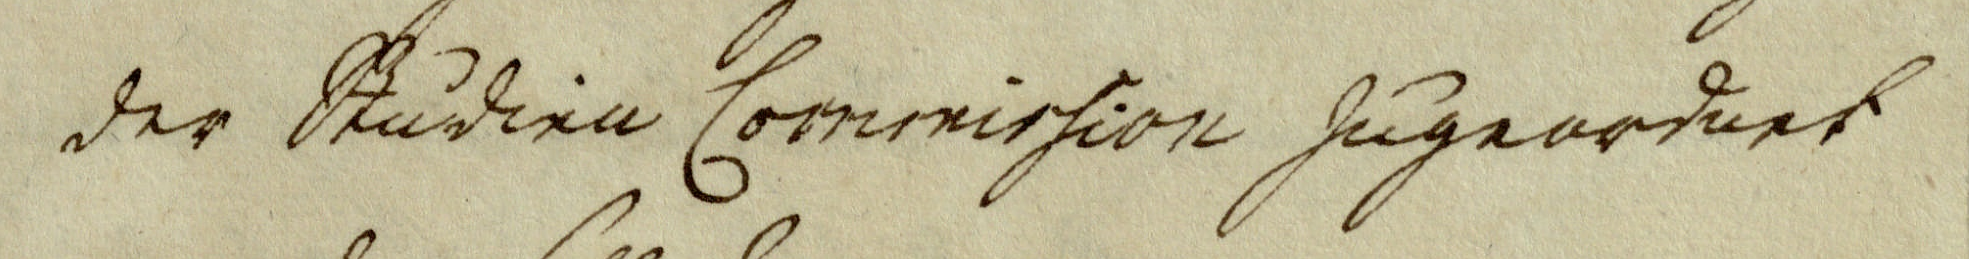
der Studien Commission zugeordnet
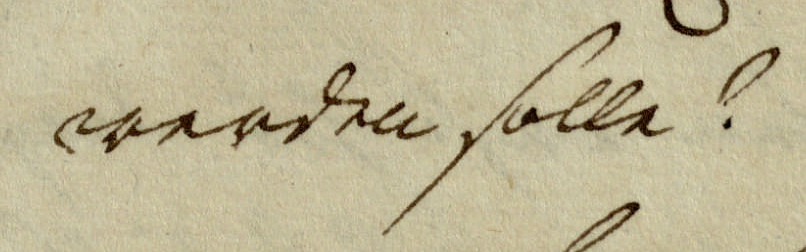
werden solle?
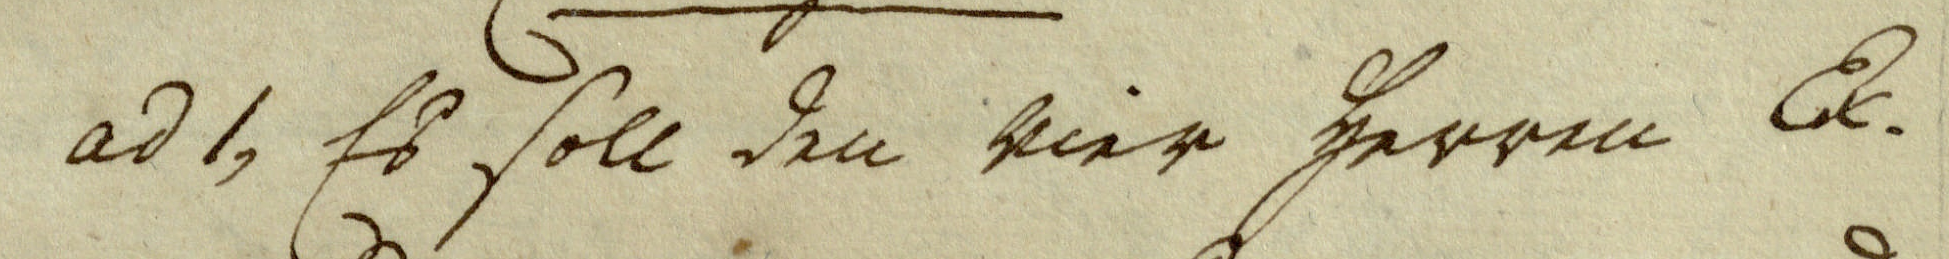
ad 1. Es soll den vier Herren Ex¬
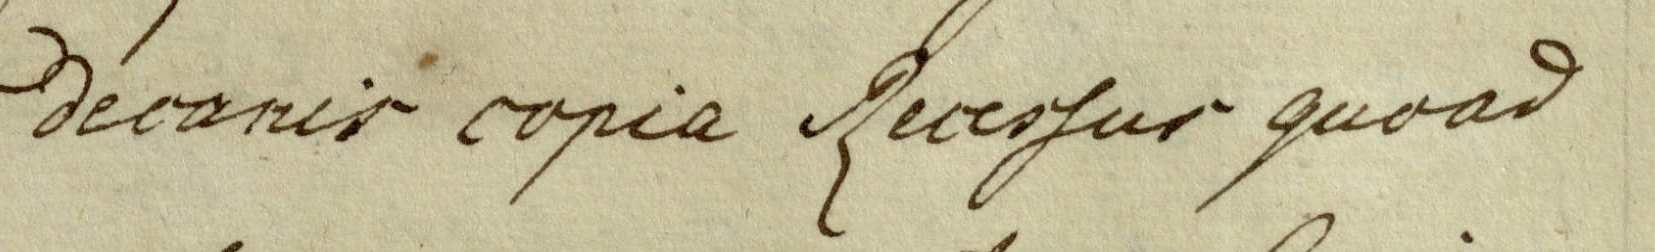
decanis copia Recessus quoad
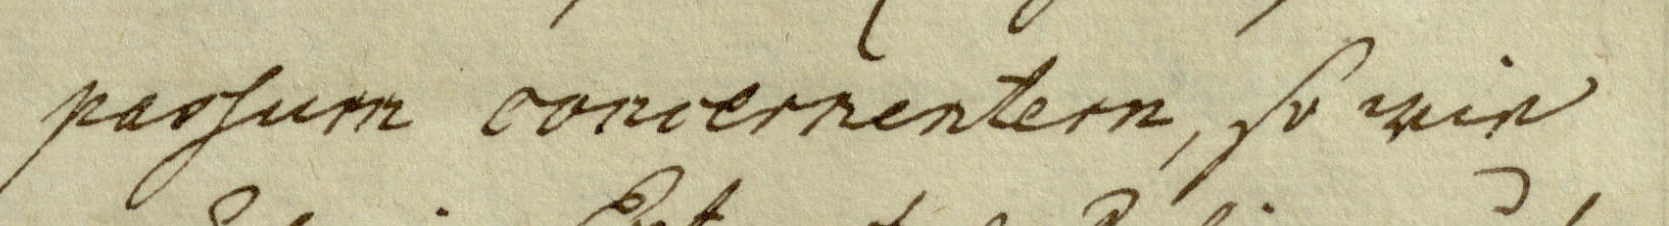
passum concernentem, so wie
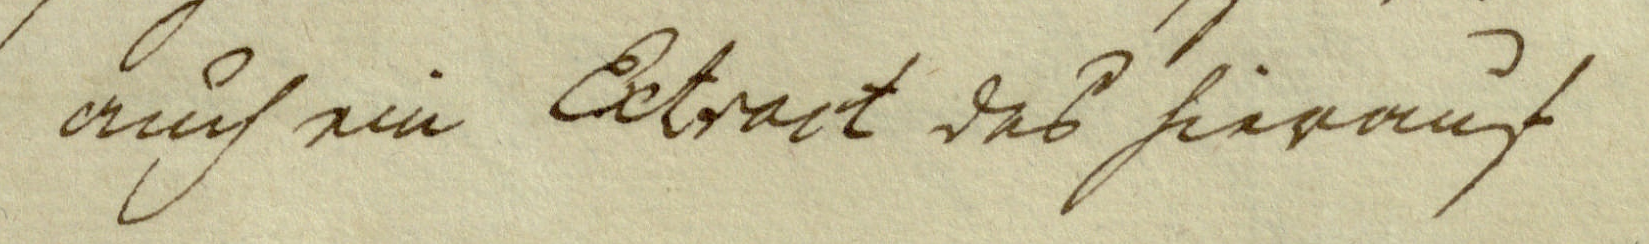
auch ein Extract des hierauf
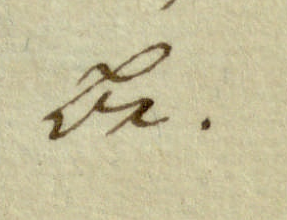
Be¬
